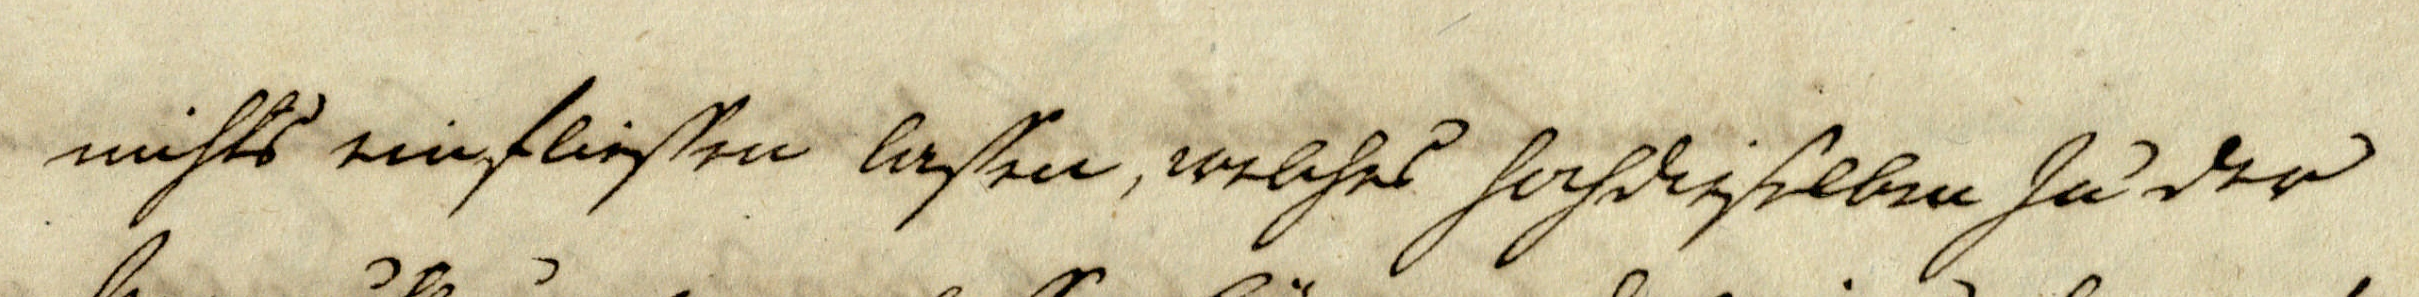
nichts einfliessen lassen, welches hochdieselben zu der
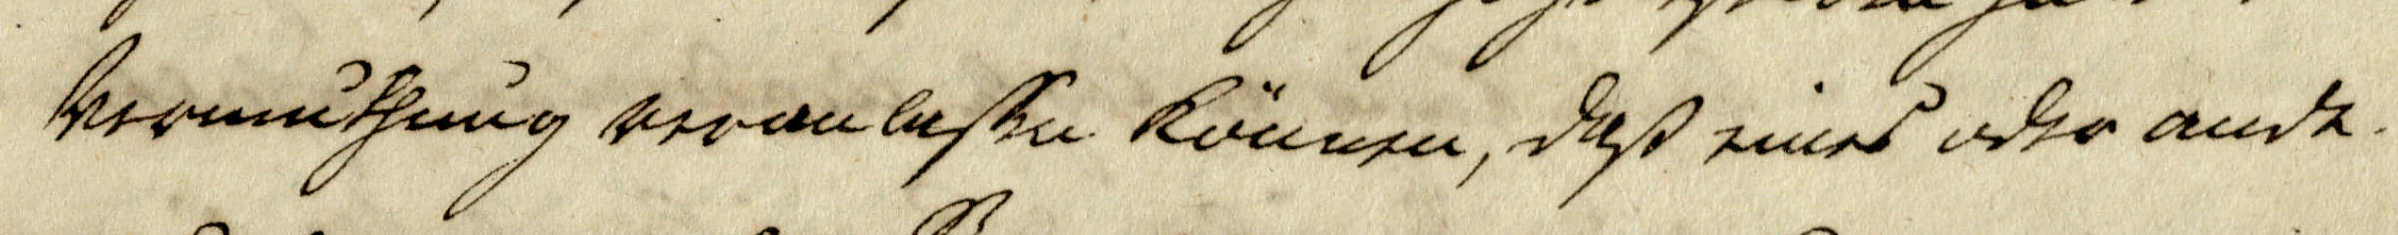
Vermuthung veranlassen können, daß eines oder ande¬
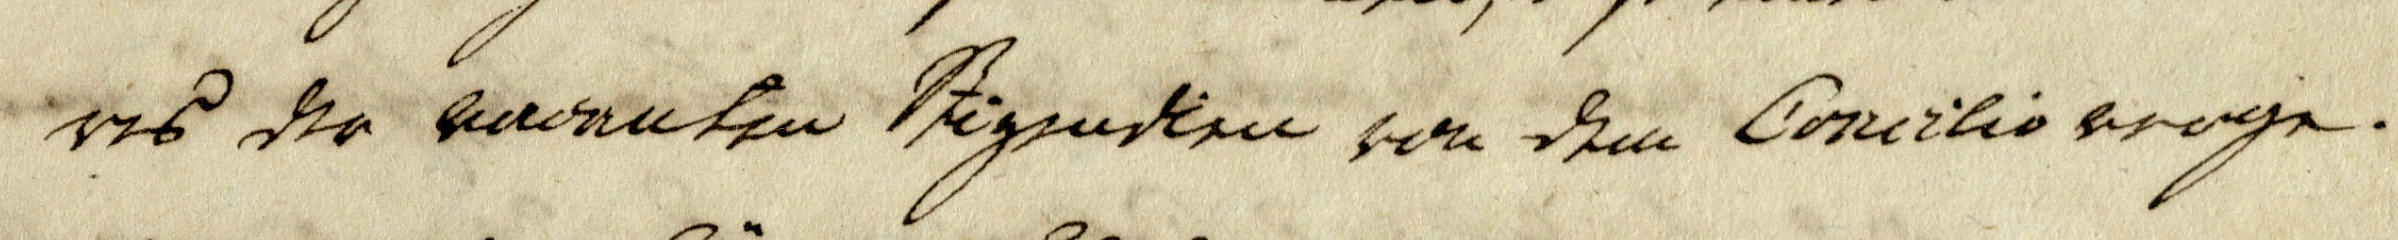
res der vacanten Stipendien von dem Concilio verge¬
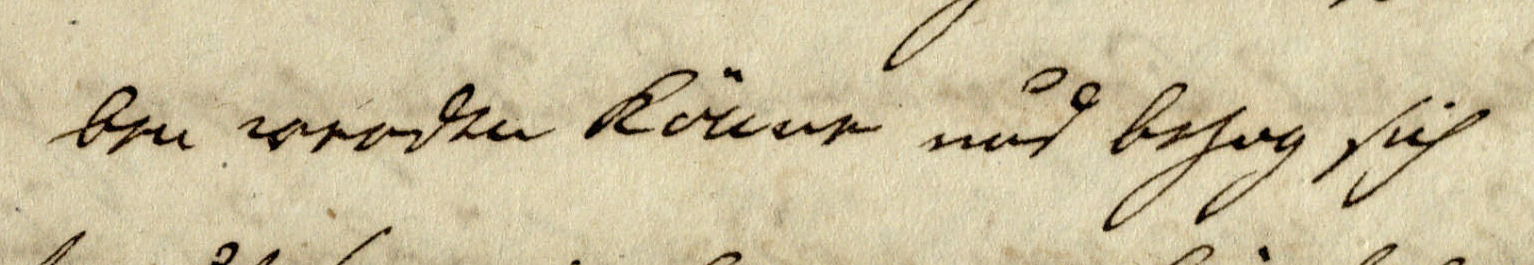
ben werden könne und bezog sich
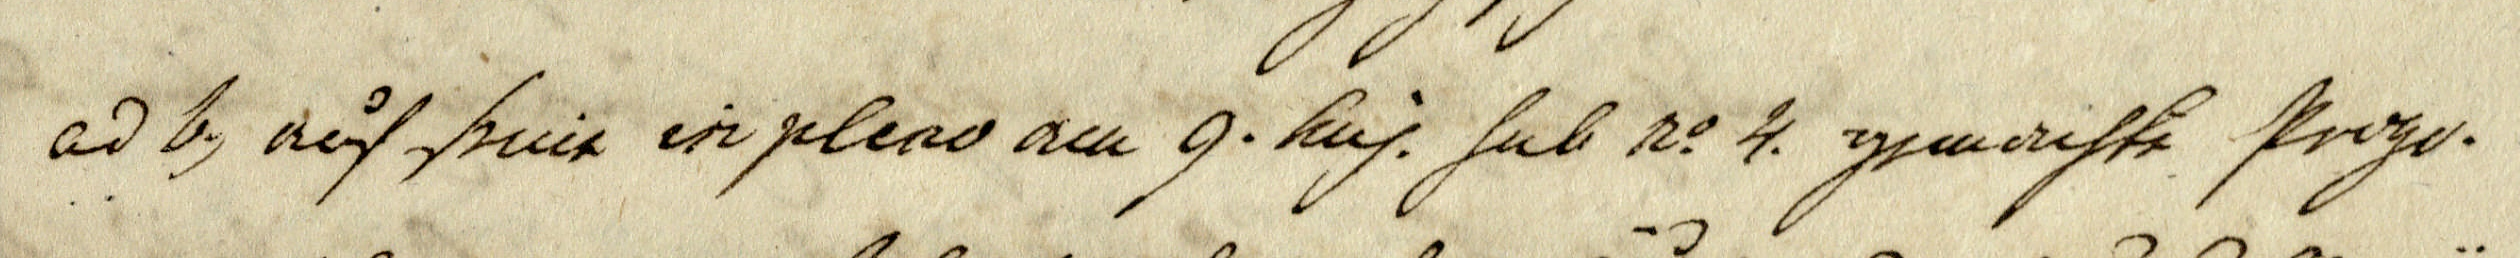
ad b., auf seine in pleno am 9. huj. sub no. 4. gemachte Propo¬
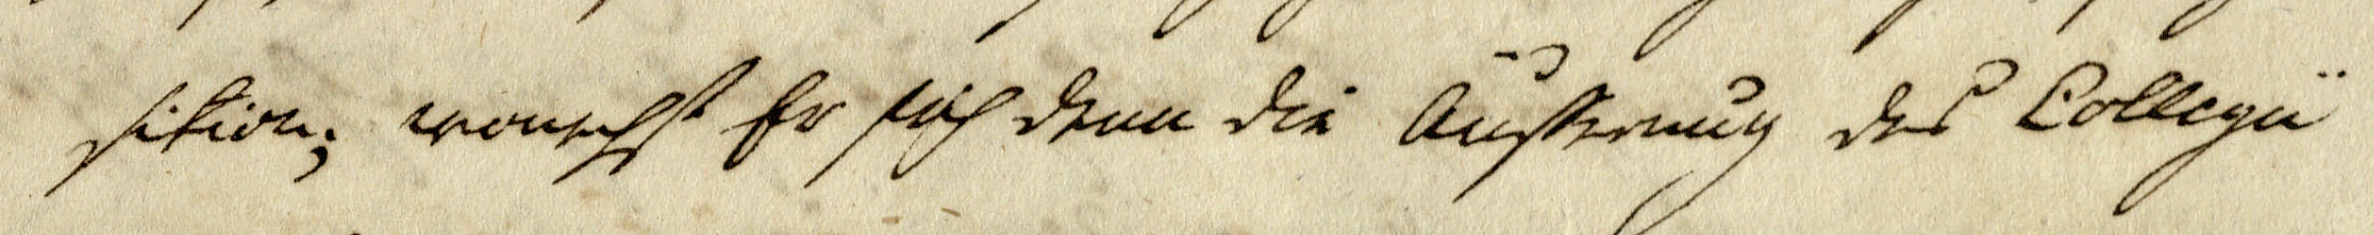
sition; wonechst Er sich denn die Äusserung des Collegii
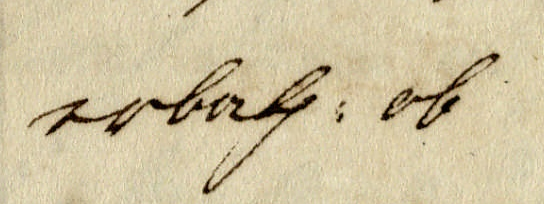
erbath: ob
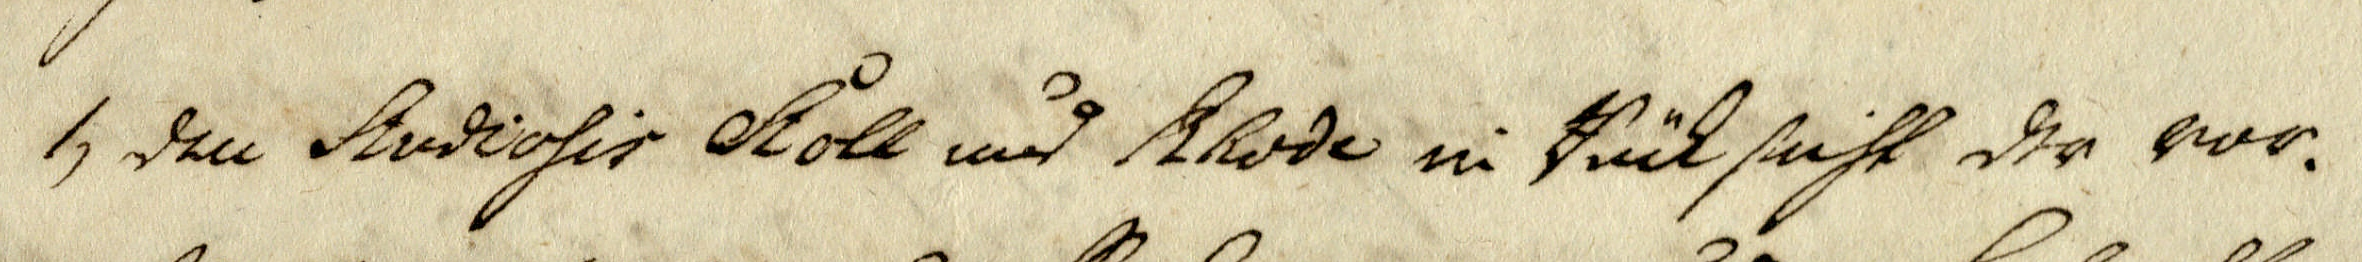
1, den Studiosis Stoll und Rhode in Rücksicht der vor¬
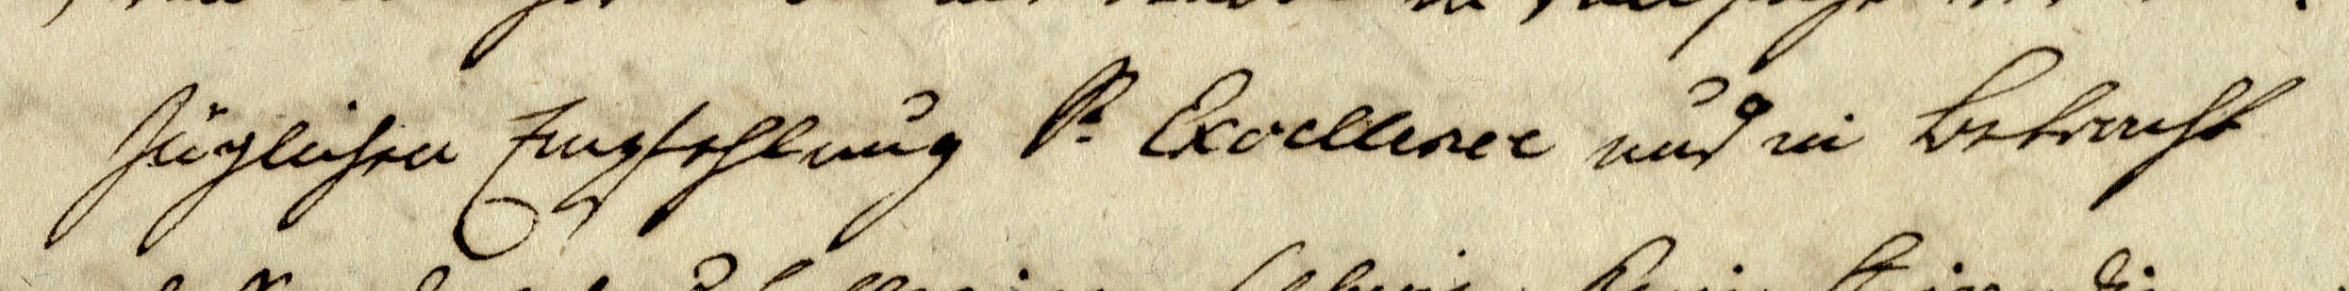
züglichen Empfehlung Sr. Excellence und in Betracht
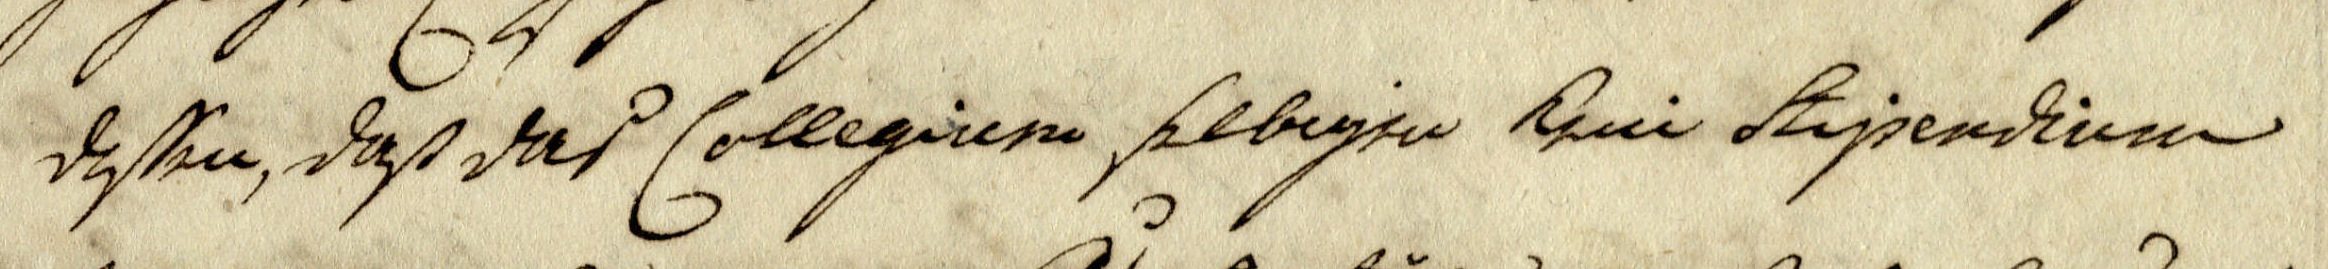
dessen, daß das Collegium selbigen kein Stipendium
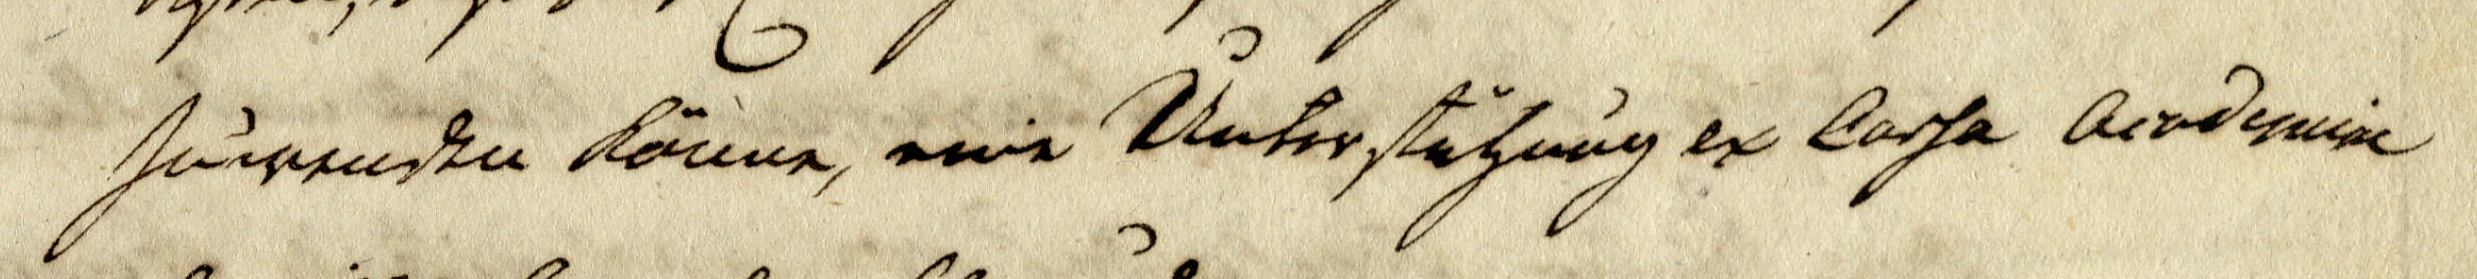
zuwenden könne, eine Unterstützung ex Cassa Academiae
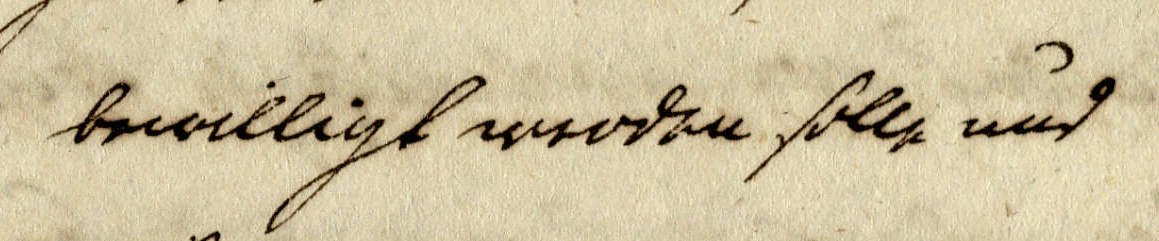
bewilligt werden solle und
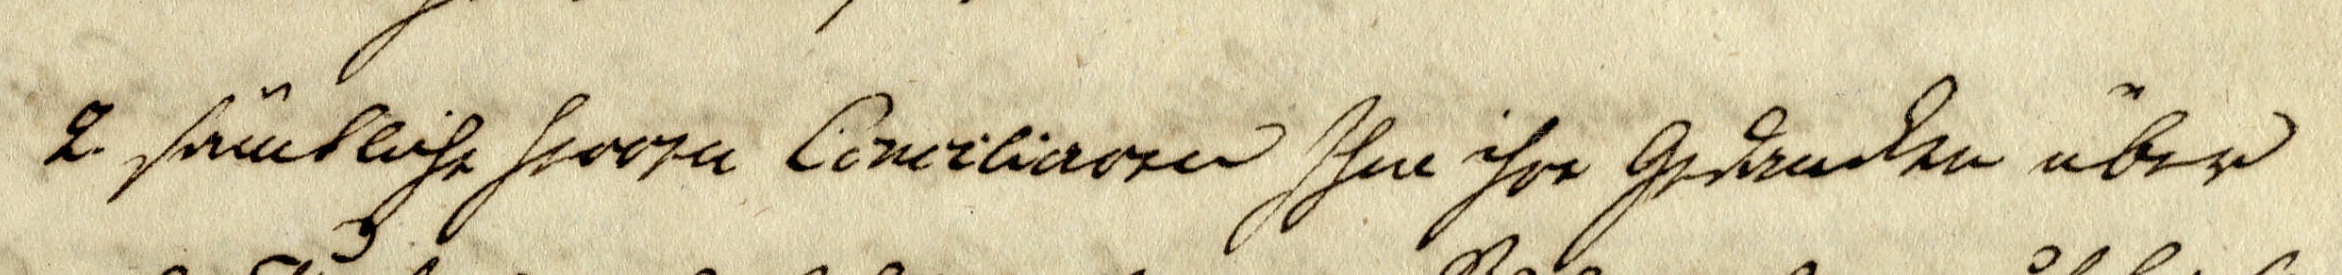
2. sämtliche Herren Conciliaren Ihm ihre Gedanken über
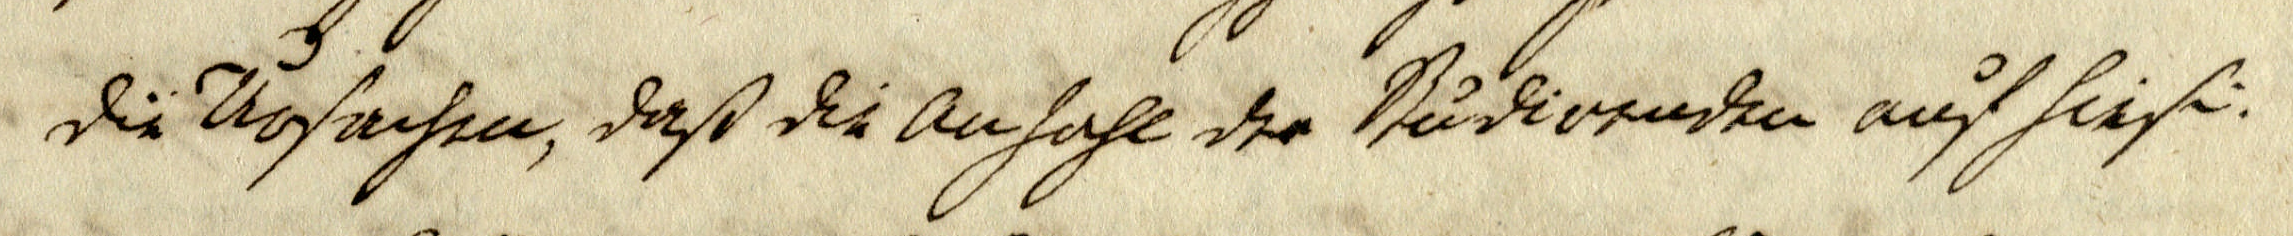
die Ursachen, daß die Anzahl der Studirenden auf hiesi¬
